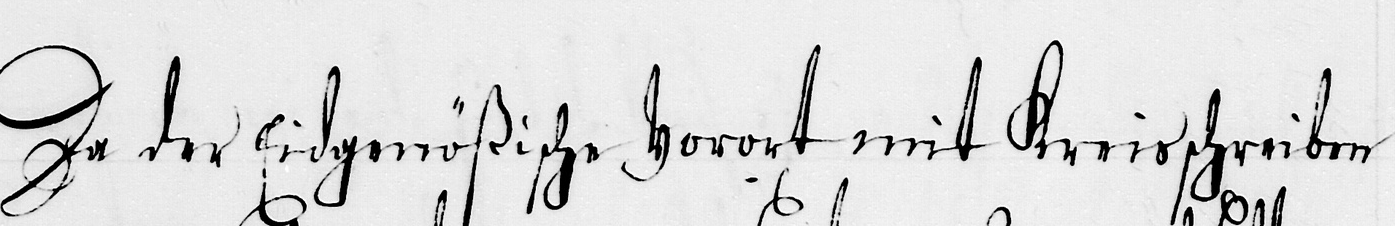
Da der Eidgenößische Vorort mit Kreisschreiben
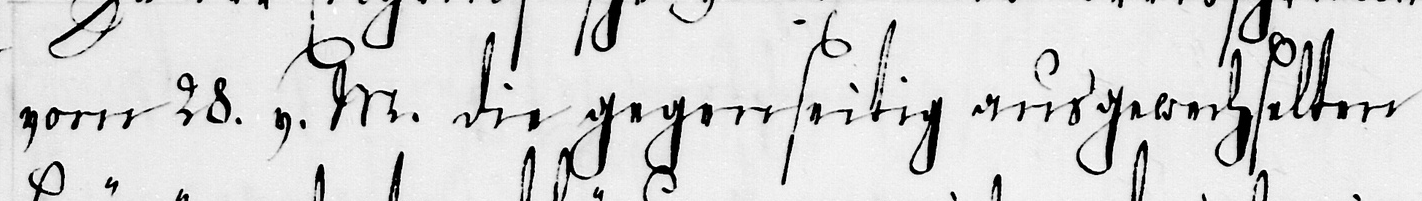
vom 28. v. M die gegenseitig ausgewechselten
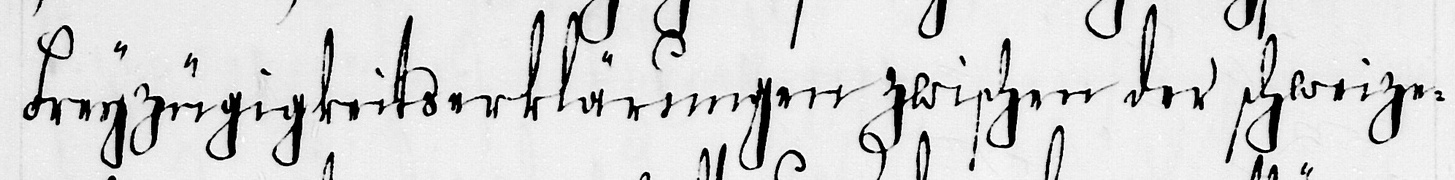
Freyzügigkeitserklärungen zwischen der schweize¬
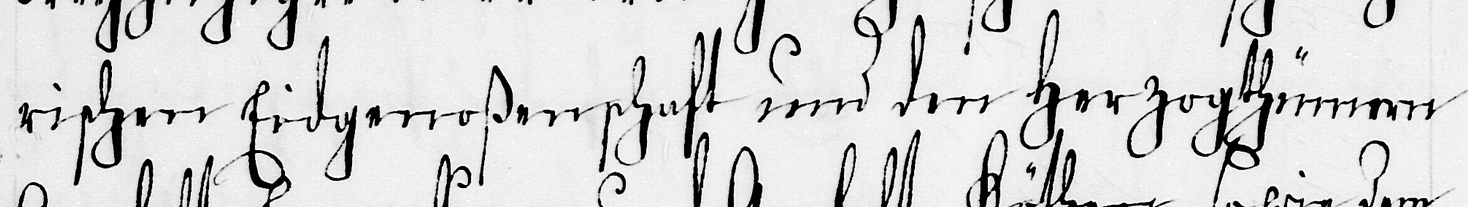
rischen Eidgenoßenschaft und den Herzogthümern
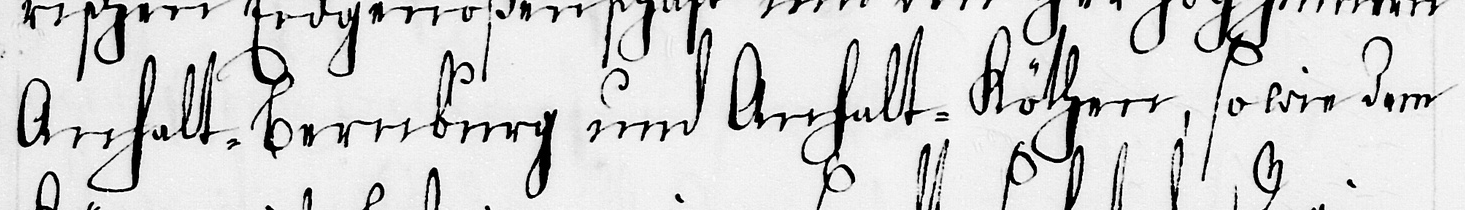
Anhalt-Bernburg und Anhalt-Köthen, so wie dem
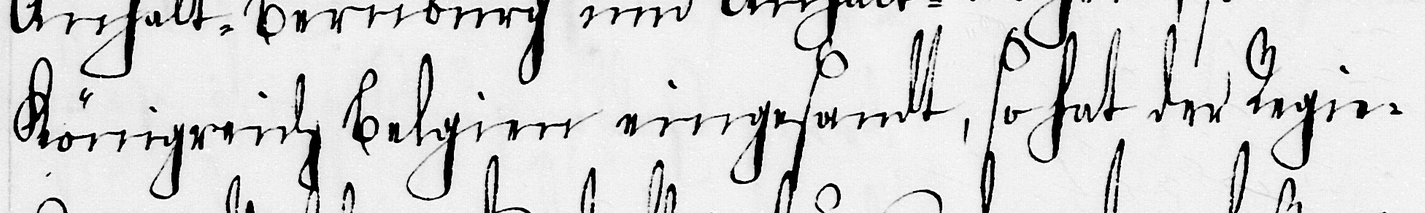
Königreich Belgien eingesandt, so hat der Regie¬
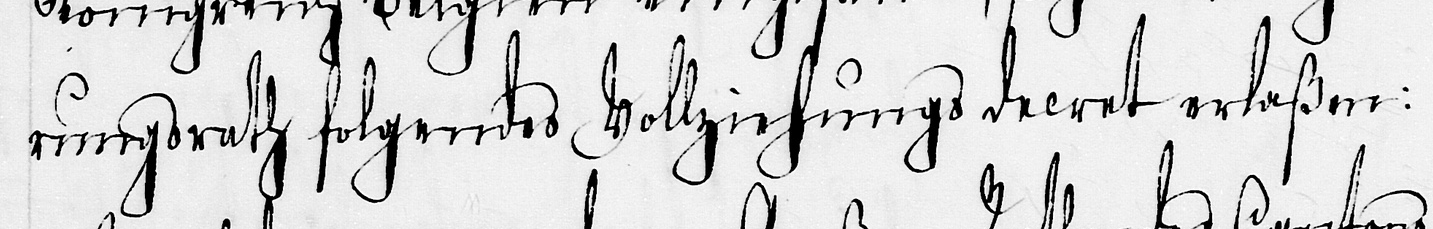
rungsrath folgendes Vollziehungsdecret erlaßen:
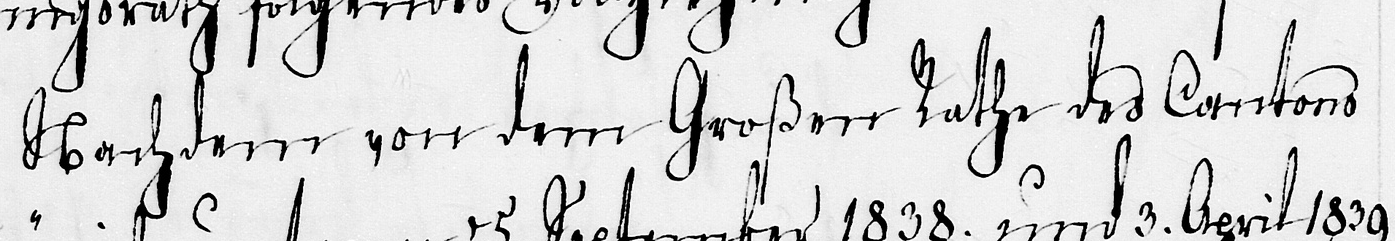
Nachdem von dem Großen Rathe des Cantons
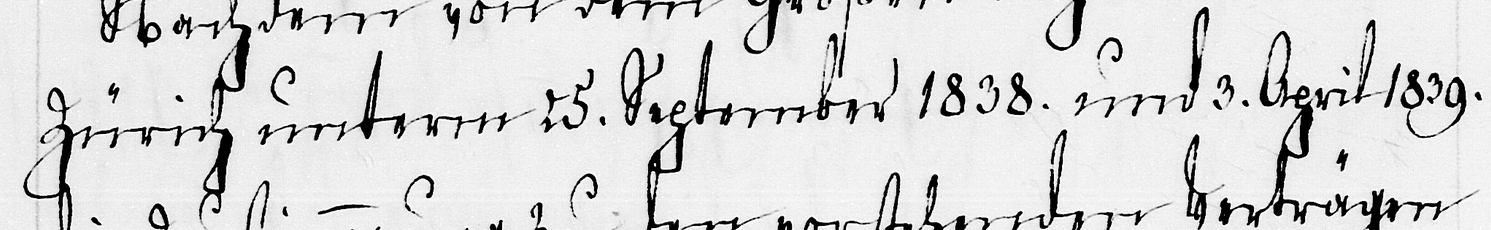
Zürich unterm 25. September 1838. und 3. April 1839.
